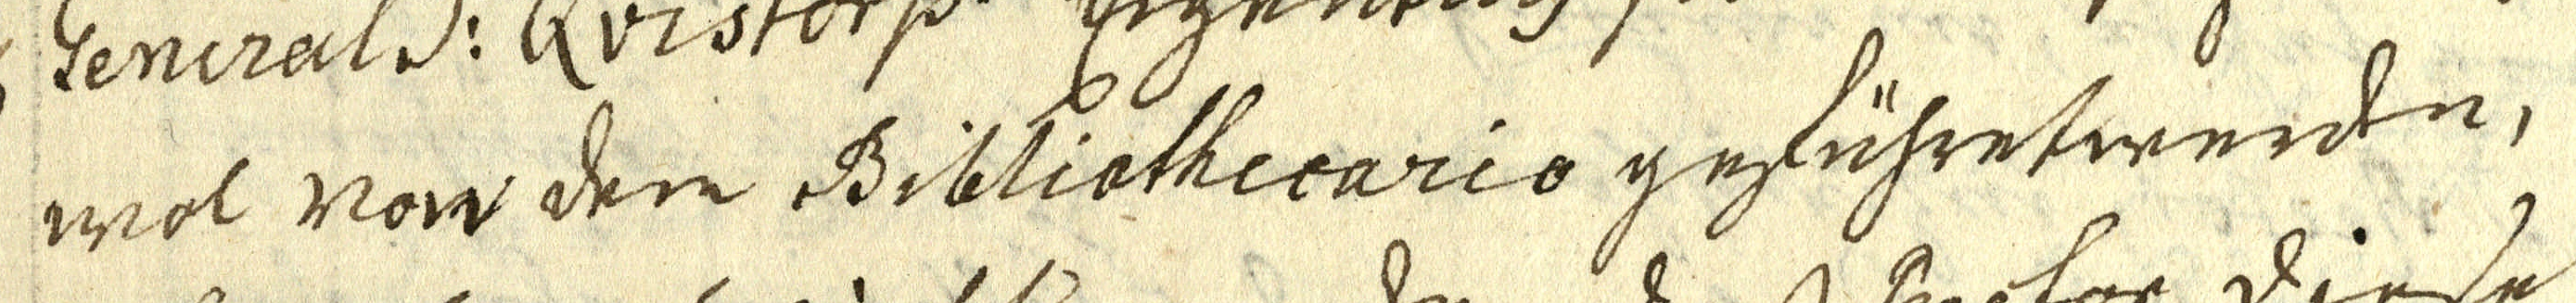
wol von dem Bibliothecario geführetwerden,
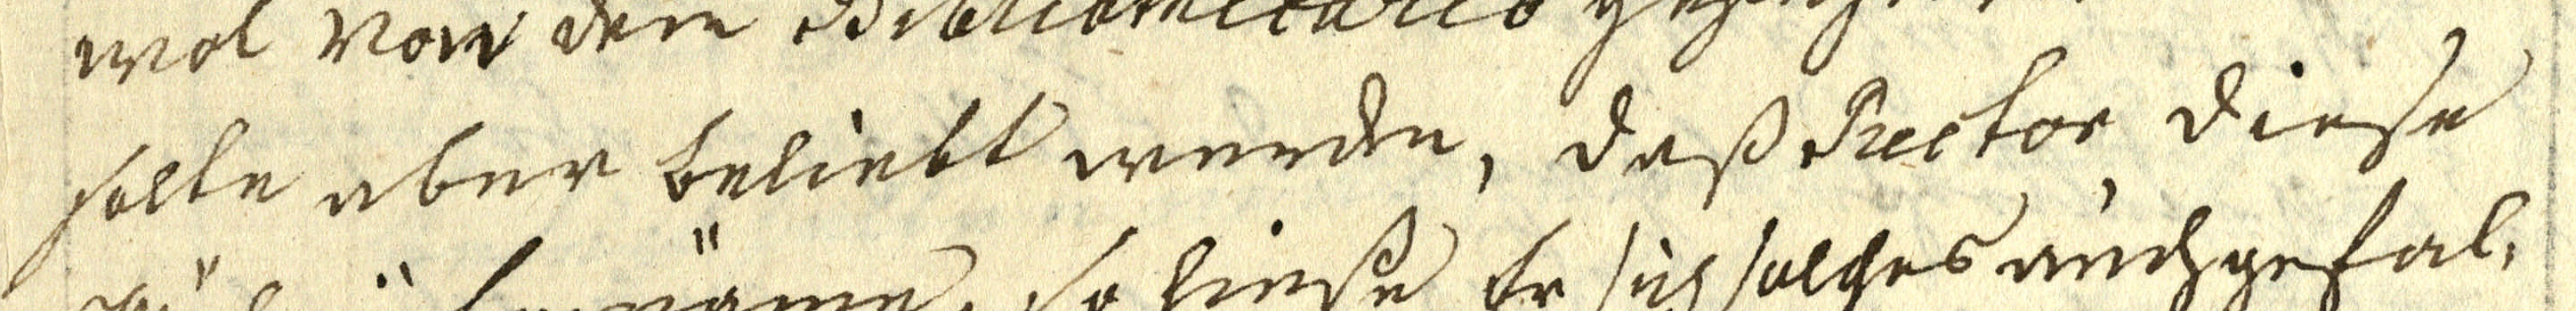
solte aber beliebt werden, daß Rector diese
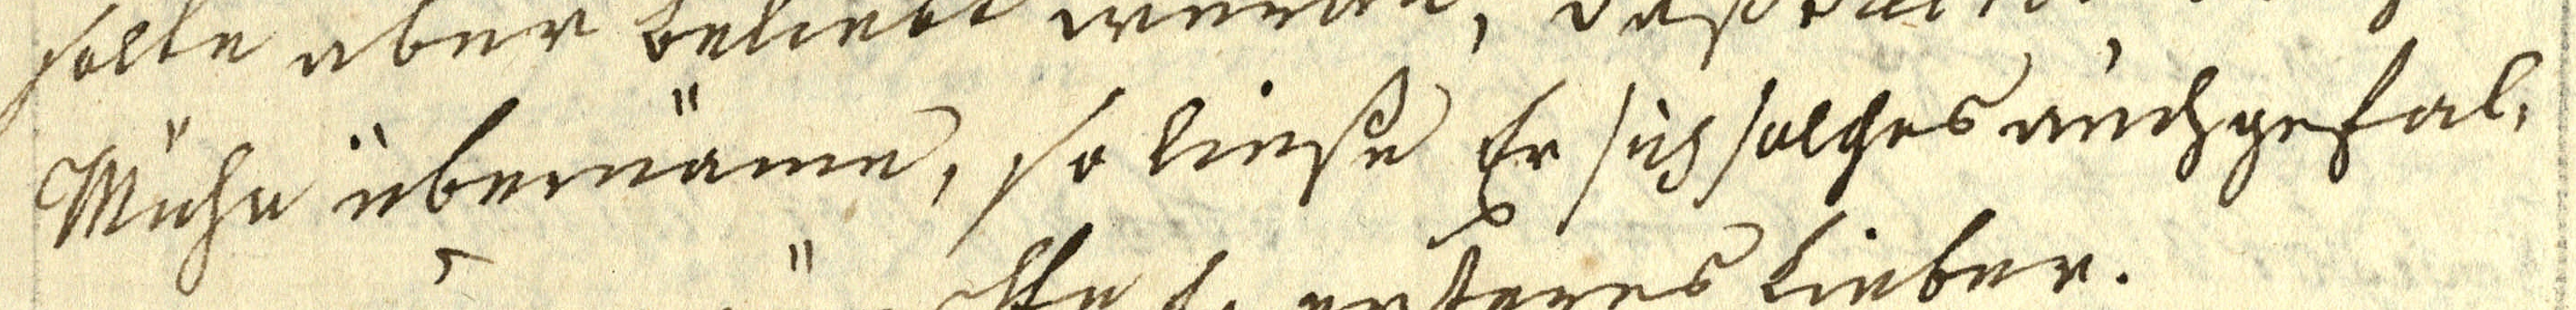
Mühe übernäme, so ließe Er sich solches auch gefal¬
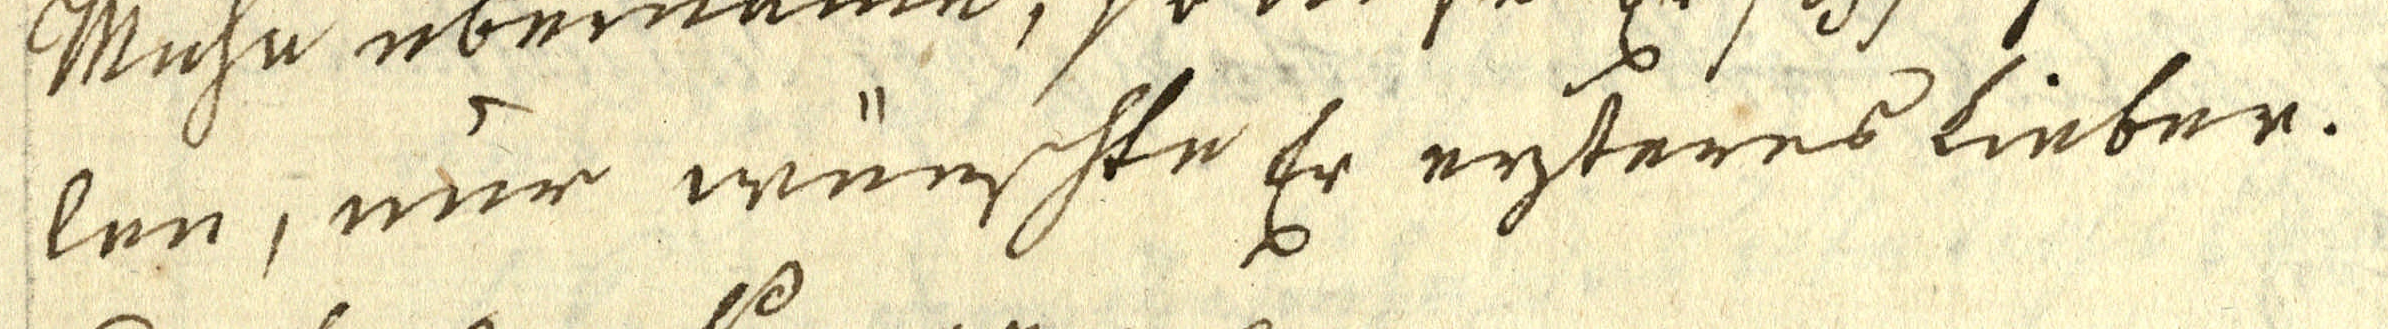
len, nur wünschte Er ersteres lieber.
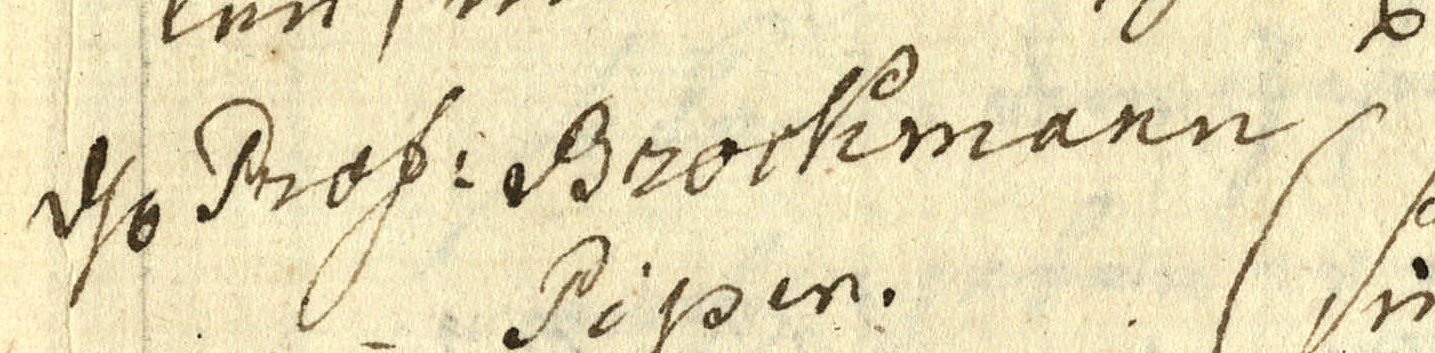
dh Prof: Brockmann
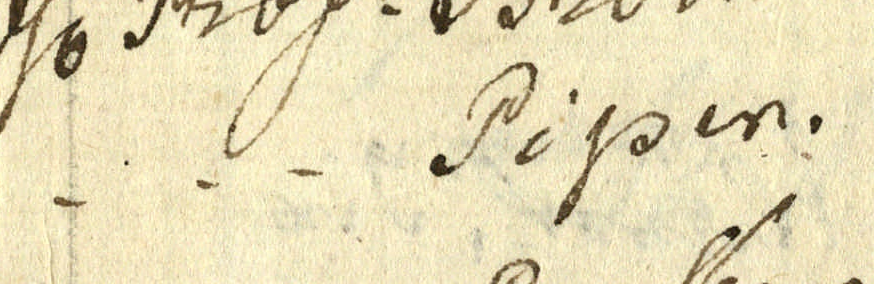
Piper.
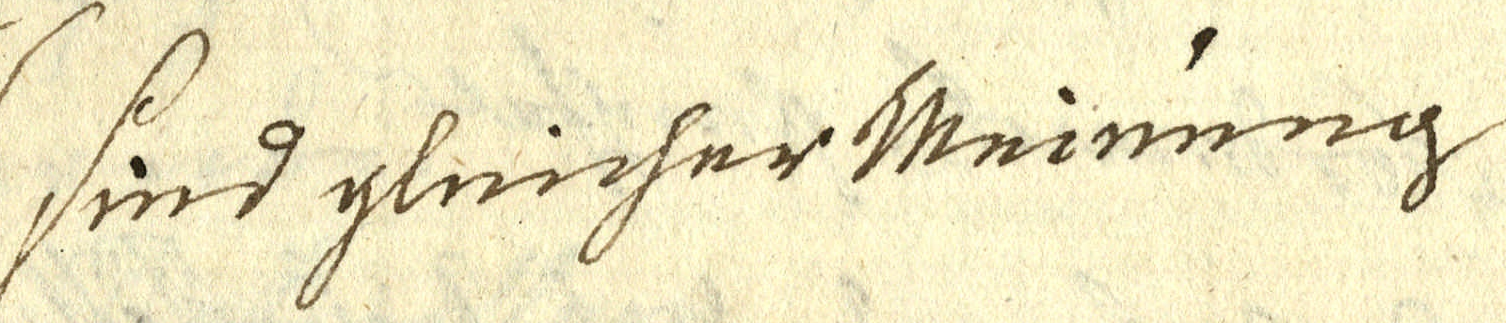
sind gleicher Meinung
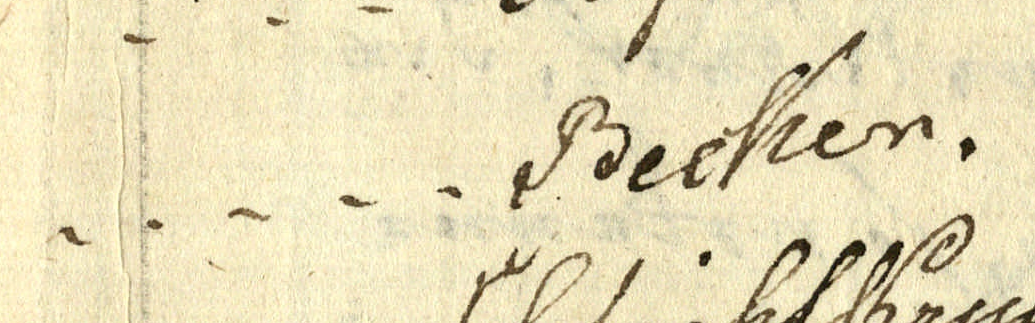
Becker.
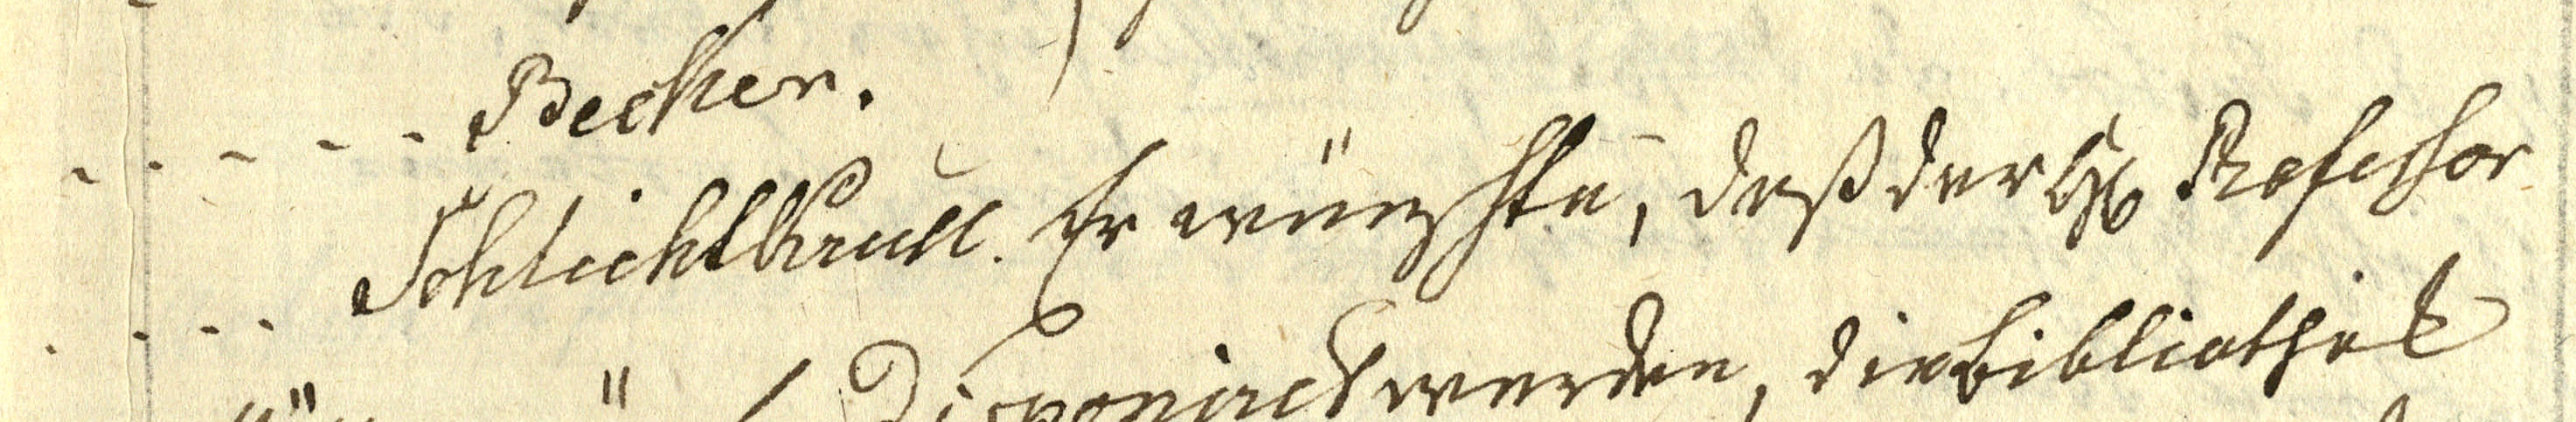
Schlichtkrull. Er wünschte, daß der H Professor
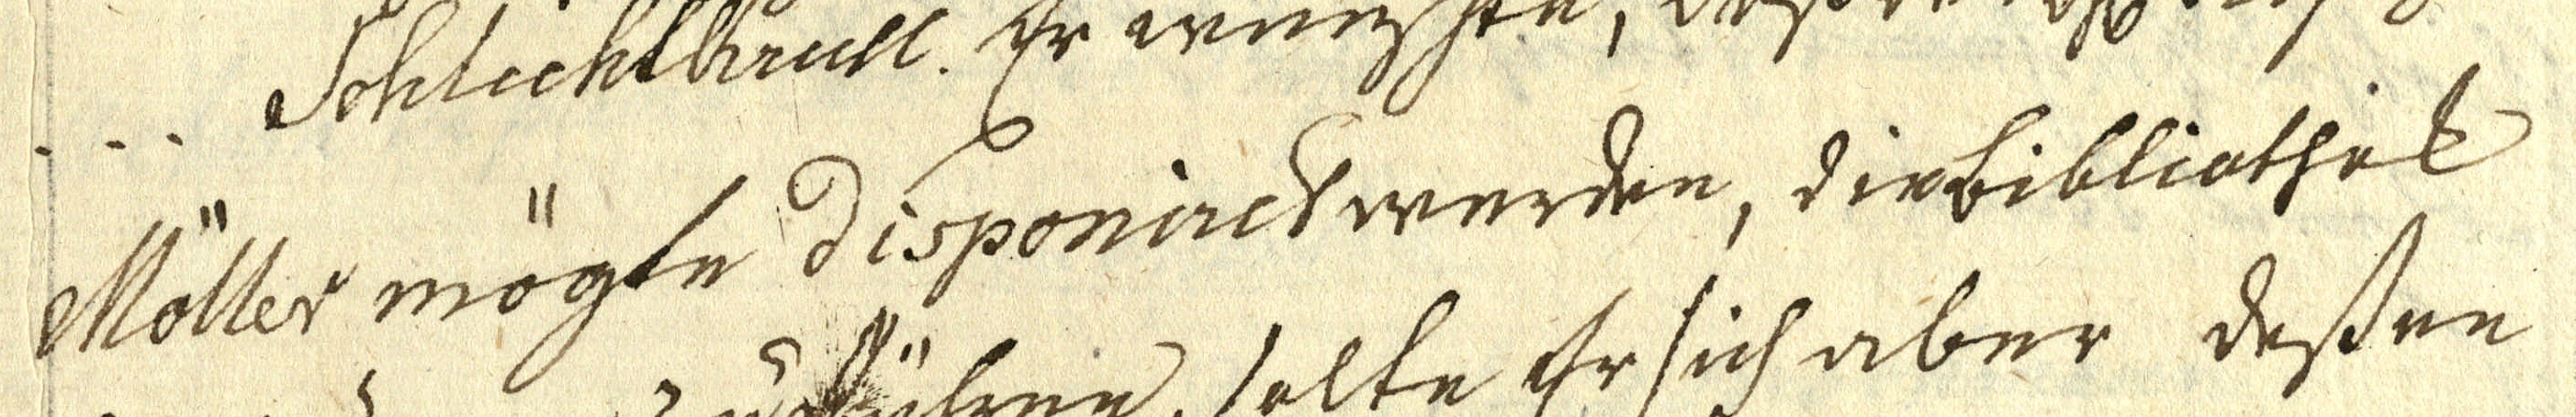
Möller mögte disponiret werden, die Bibliothek
